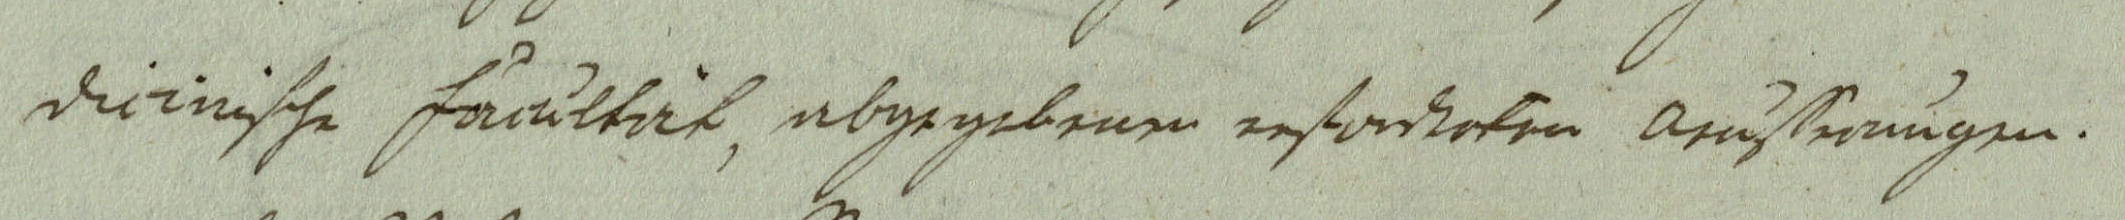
dicinische Facultät, abgegebenen erforderten Aeusserungen.
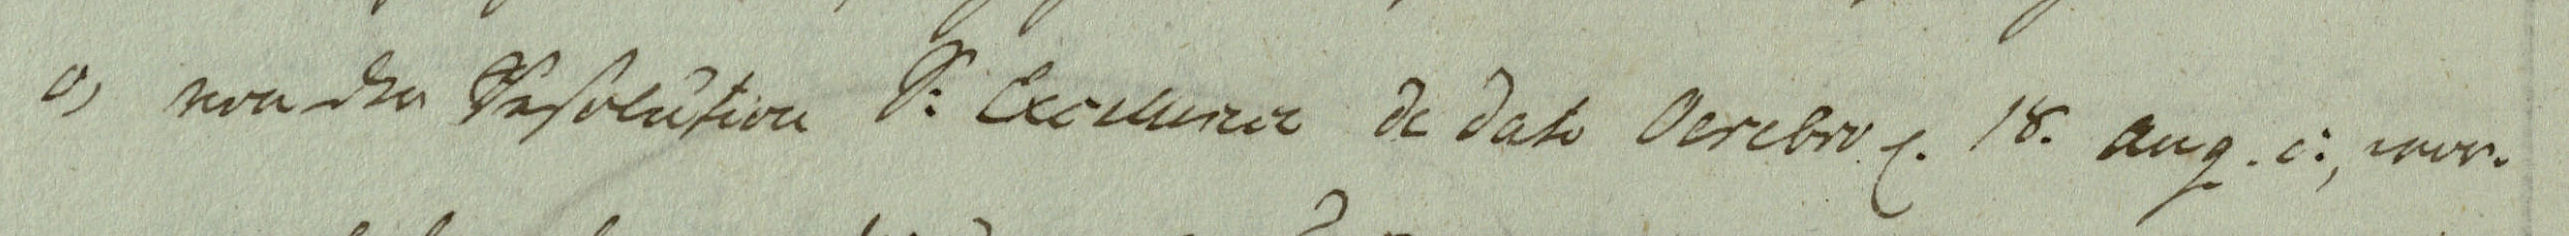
c, von der Resolution Sr. Excellence de dato Oerebro l. 18. Aug. ei, wor¬
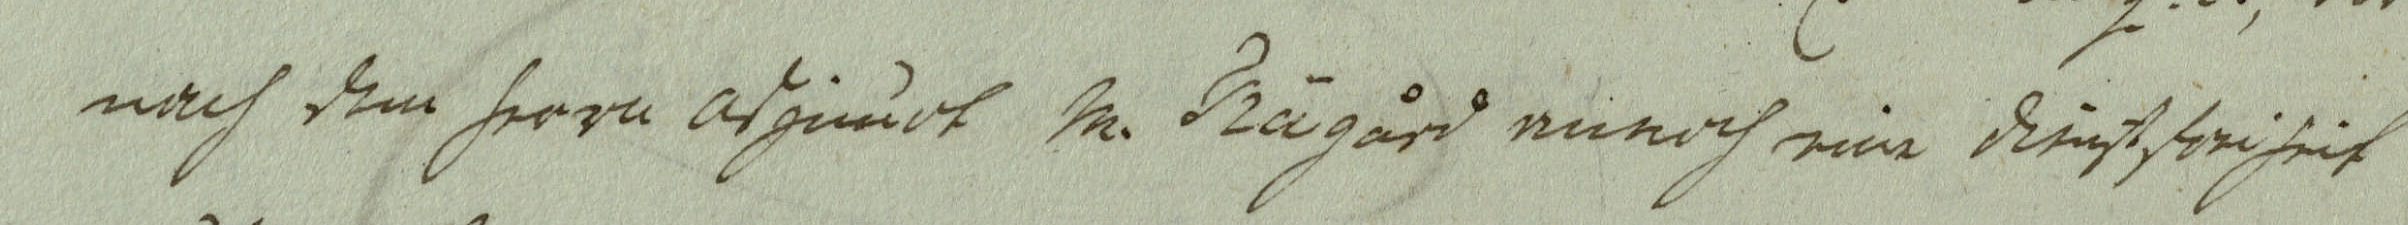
nach dem herrn Adjunct M. Trägård annoch eine Dienstfreiheit
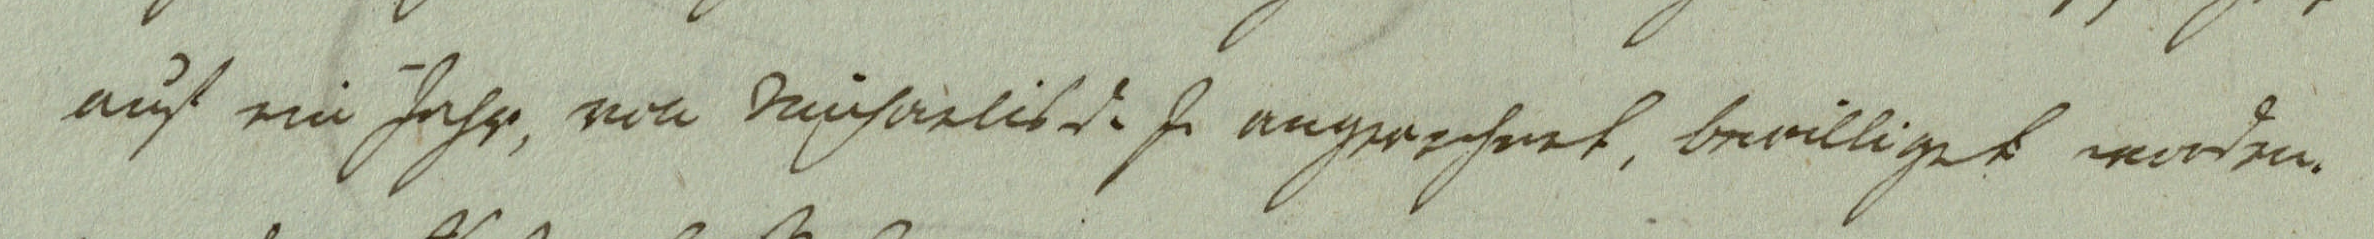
auf ein Jahr, von Michaelis d. J. angerechnet, bewilliget worden.
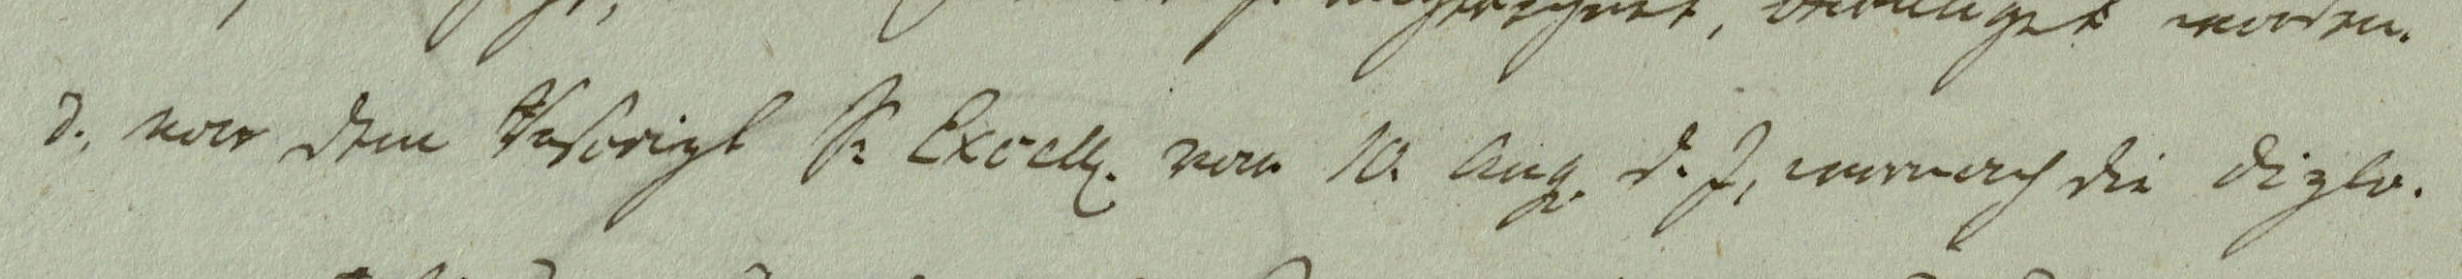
d, von dem Rescript Sr. Excell. vom 10. Aug. d. J. wornach die Diplo¬
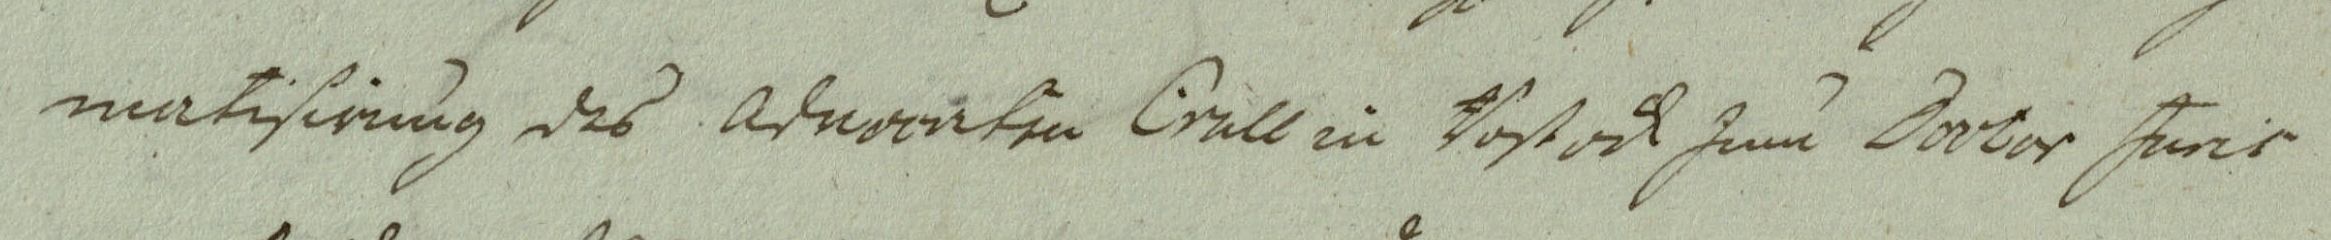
matisirung des Advocaten Crull in Rostock zum Doctor Juris
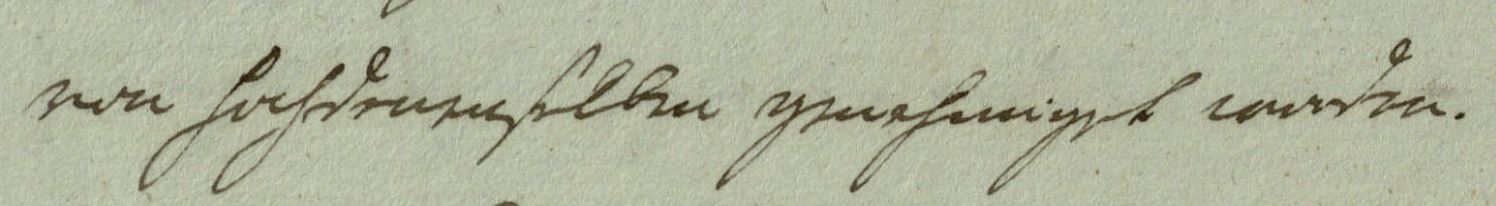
von hochdenenselben genehmiget worden.
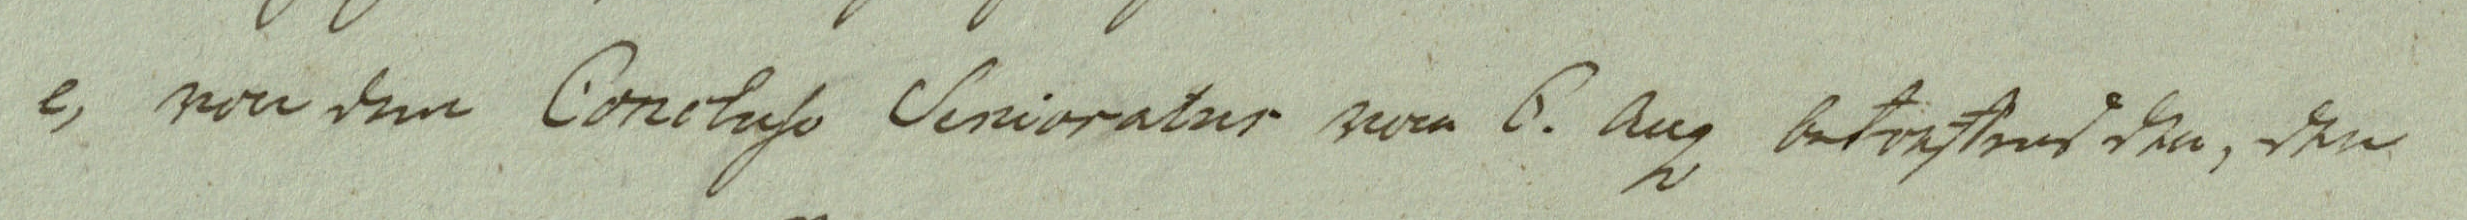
e, von dem Concluso Senioratus vom 6. Aug. betreffend den, den
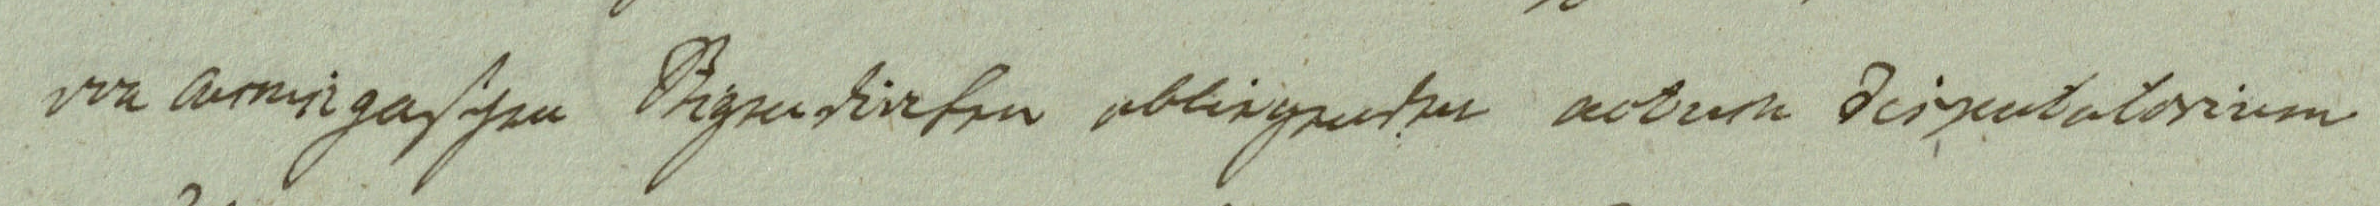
von Aemingaschen Stipentiaten obliegenden actum disputatorium
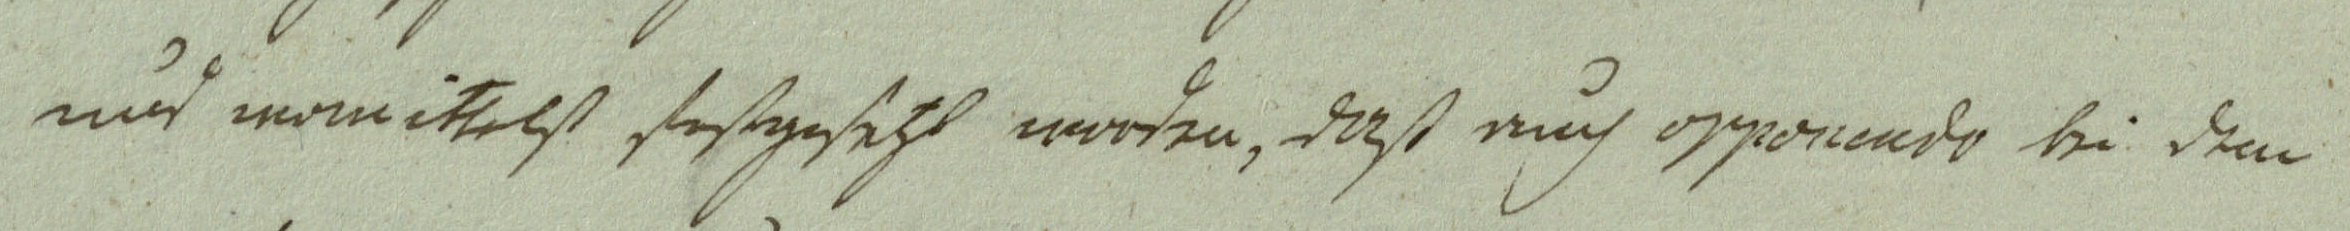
und womittlest festgesetzt worden, daß auch opponendo bei dem
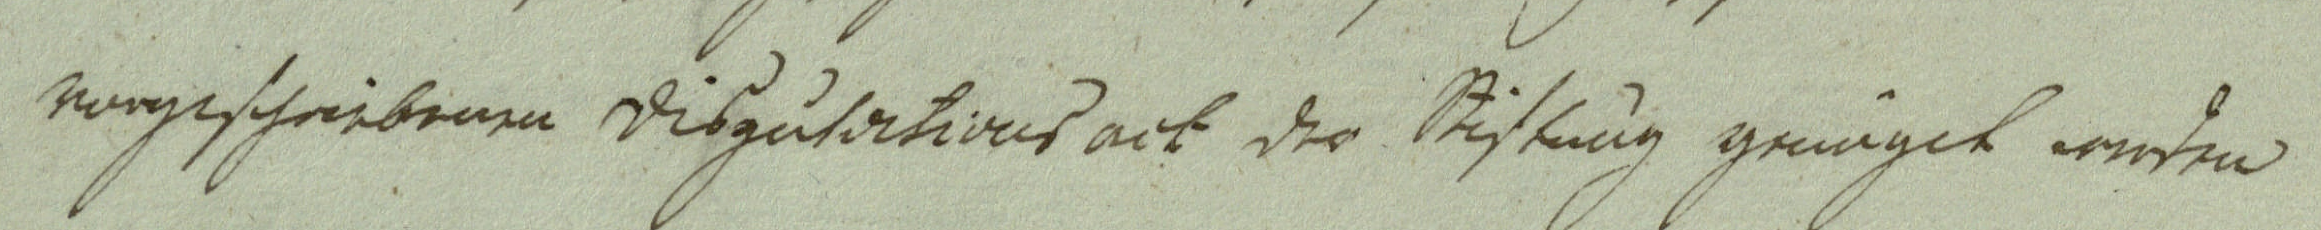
vorgeschriebenen Disputations act der Stiftung genüget werden
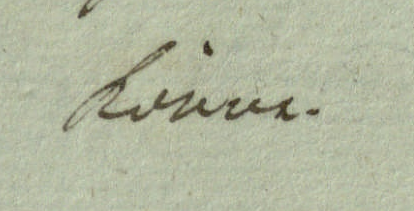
könne.
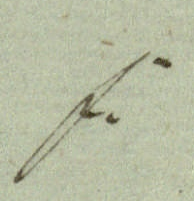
f,
